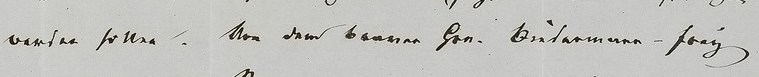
werden sollen. Von dem braven Hrn. Biedermann-Frey
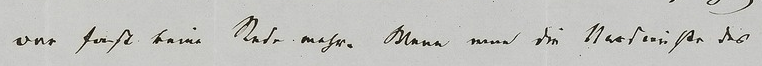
war fast keine Rede mehr. Wenn man die Verdienste des
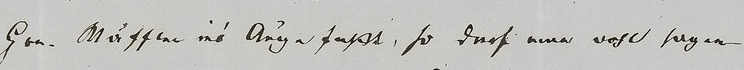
Hrn. Wäffler ins Auge faßt, so darf man wohl sagen
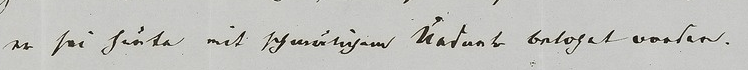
er sei heute mit schmälichem Undank belohnt worden.
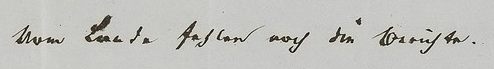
Vom Lande fehlen noch die Berichte.
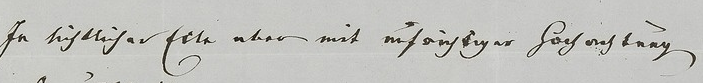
In sichtlicher Eile aber mit aufrichtiger Hochachtung
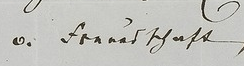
&. Freundschaft,
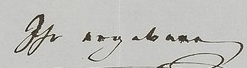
Ihr ergebener
